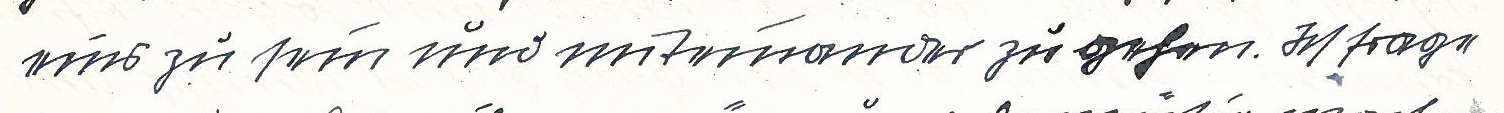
eins zu sein und miteinander zu gehen. Ich frage
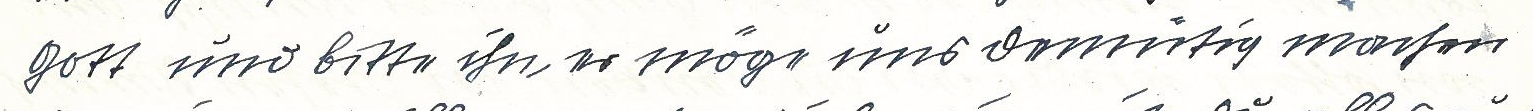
Gott und bitte ihn, er möge uns demütig machen
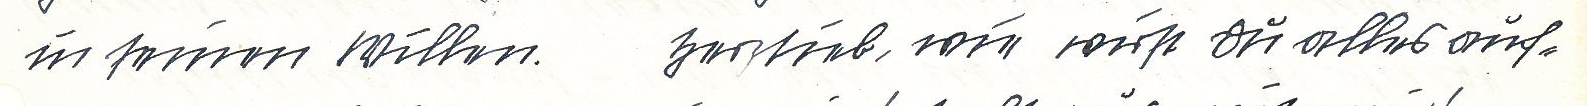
in seinem Willen. Herzlieb, wie wirst Du alles auf¬
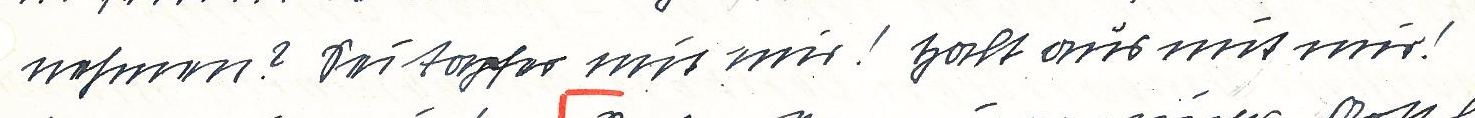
nehmen? Sei tapfer mit mir! Halt aus mit mir!
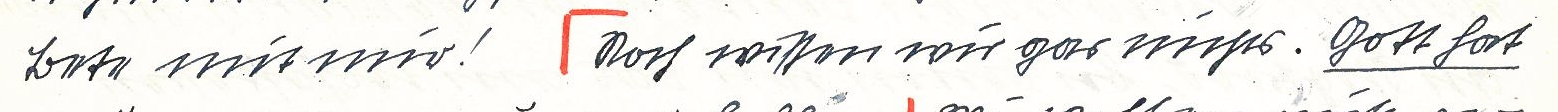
Bete mit mir! Noch wissen wir gar nichts. Gott hat
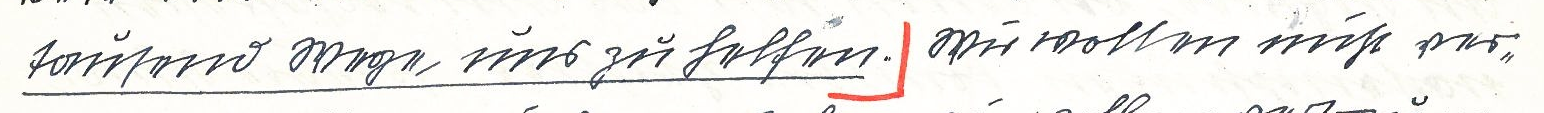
tausend Wege, uns zu helfen. Wir wollen nicht ver¬
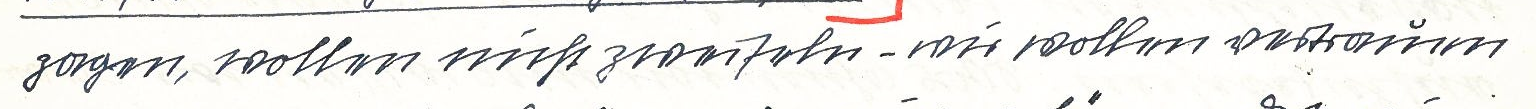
zagen, wollen nicht zweifeln – wir wollen vertrauen
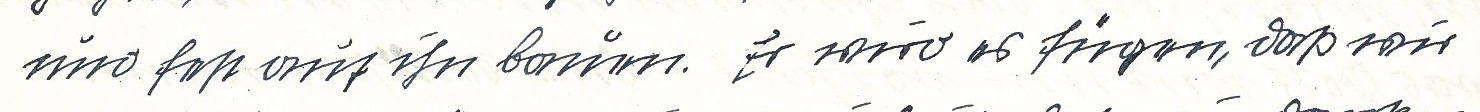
und fest auf ihn bauen. Er wird es fügen, daß wir
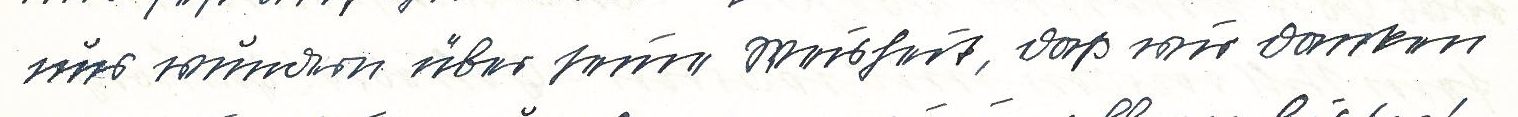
uns wundern über seine Weisheit, daß wir danken
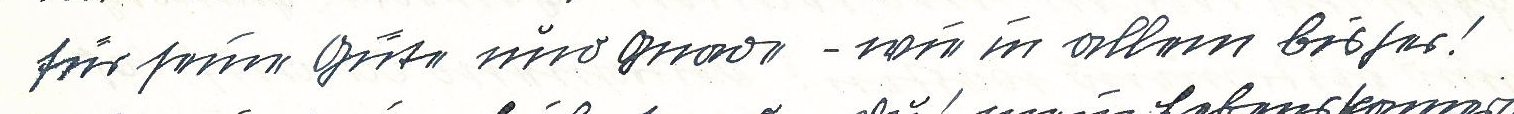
für seine Güte und Gnade – wie in allem bisher!
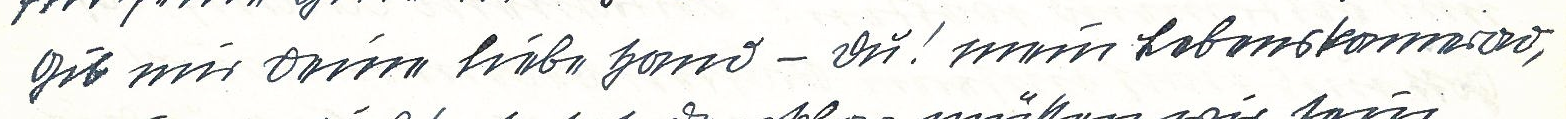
Gib mir Deine liebe Hand – Du! Mein Lebenskamerad,
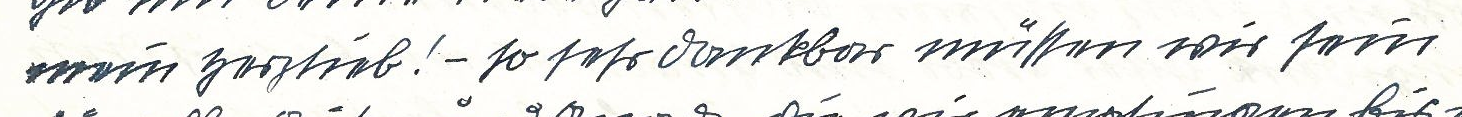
mein Herzlieb! – so sehr dankbar müssen wir sein
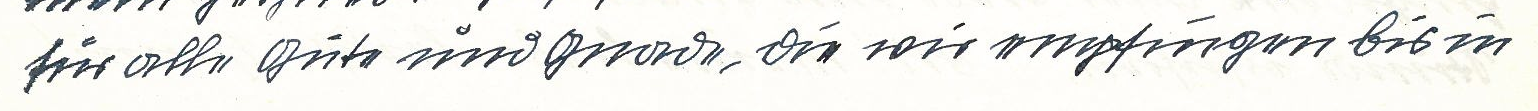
für alle Güte und Gnade, die wir empfingen bis in
